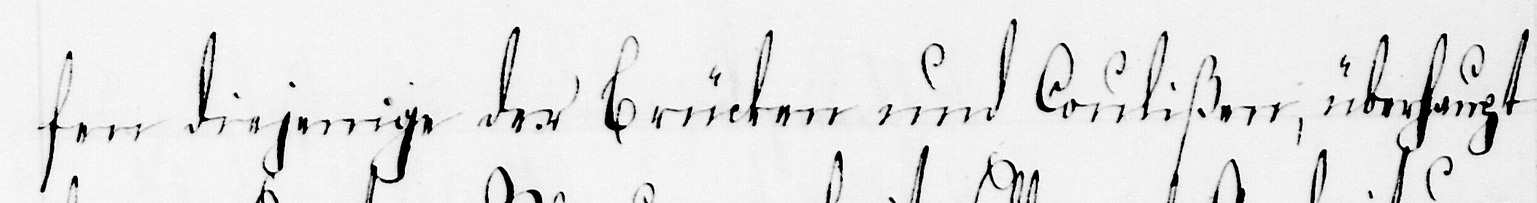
fen diejenige der Brücken und Coulißen, überhaupt
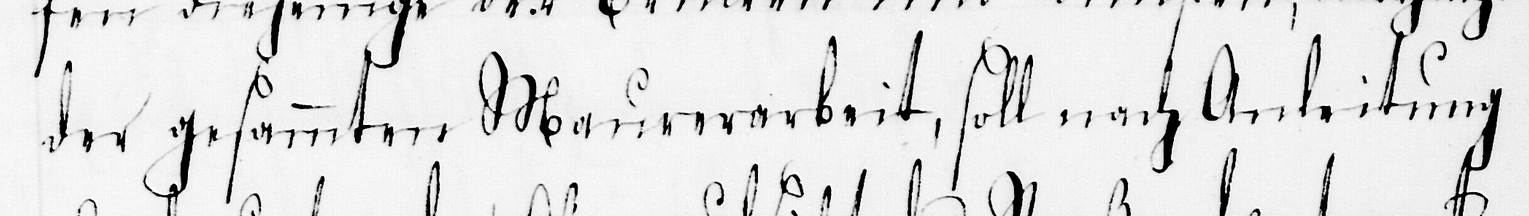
der gesammten Maurerarbeit, soll nach Anleitung
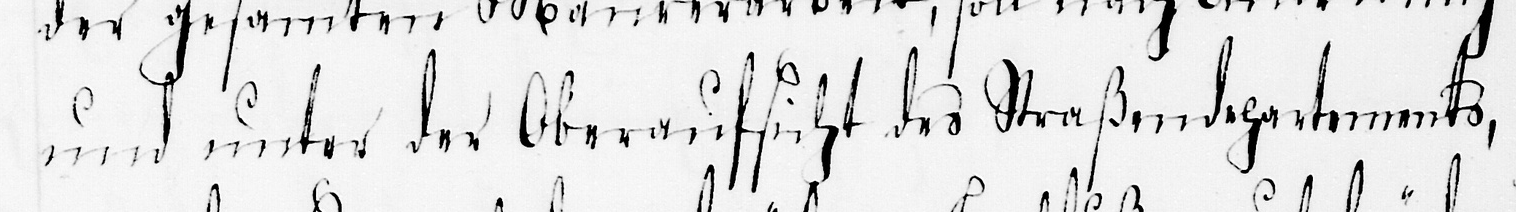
und unter der Oberaufsicht des Straßendepartements,
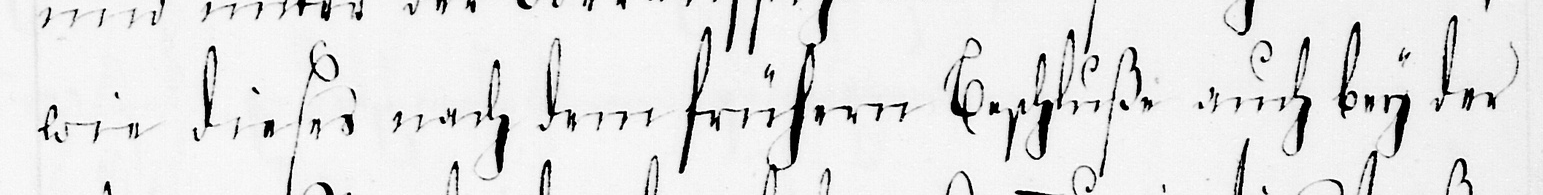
wie dieses nach dem frühern Beschluße auch bey der
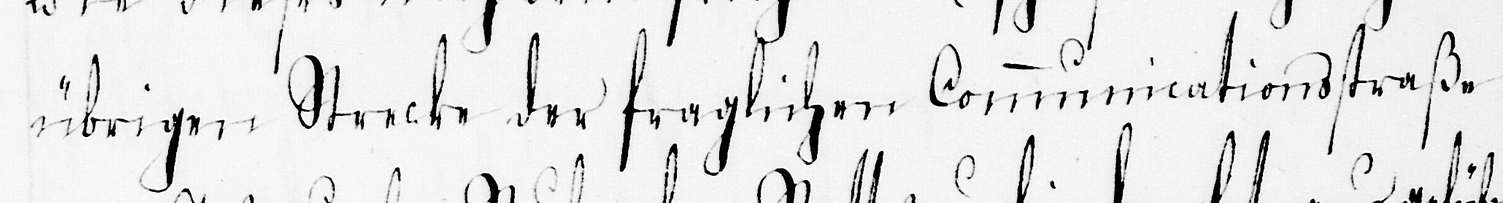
übrigen Strecke der fraglichen Communicationsstraße
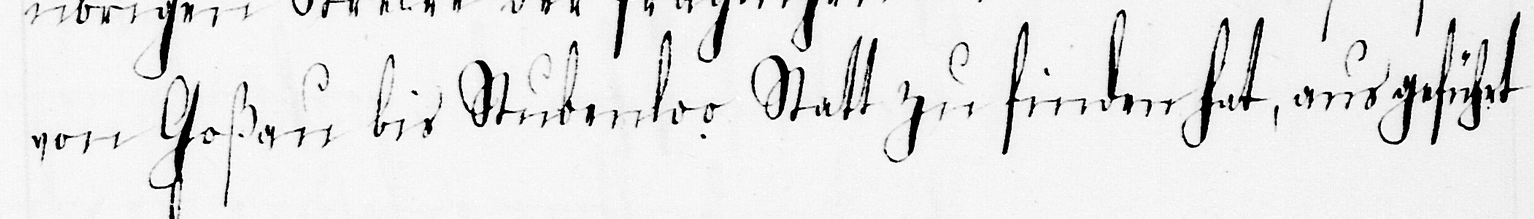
von Goßau bis Stubenloo Statt zu finden hat, ausgeführt
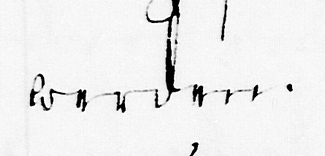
werden.
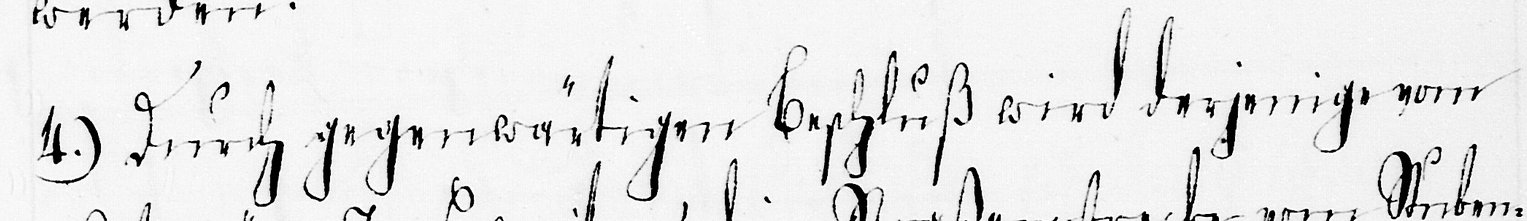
4.) Durch gegenwärtigen Beschluß wird derjenige vom
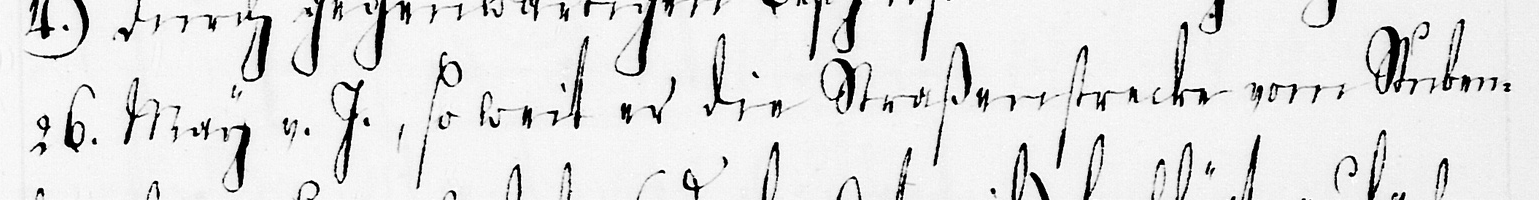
26. May v. J., so weit er die Straßenstrecke vom Stuben¬
